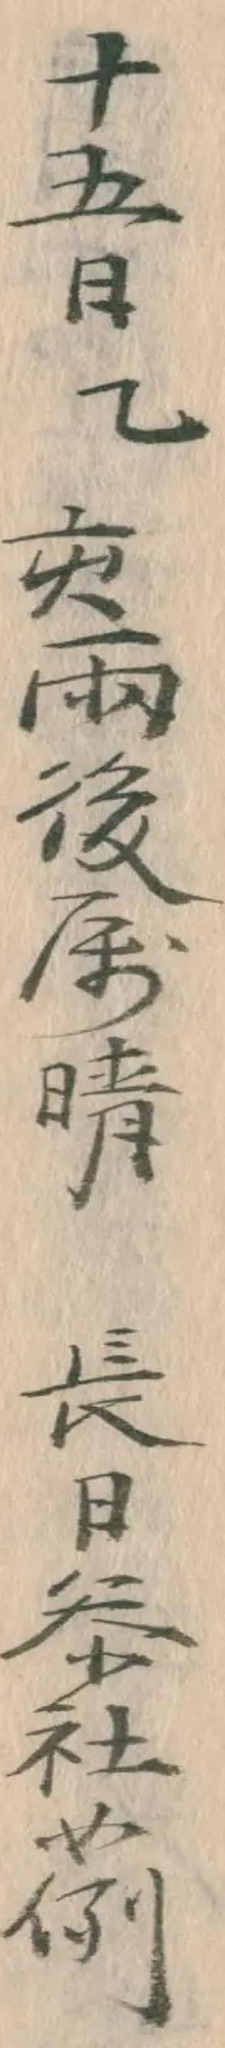十五日乙亥雨後属晴長日参社如例
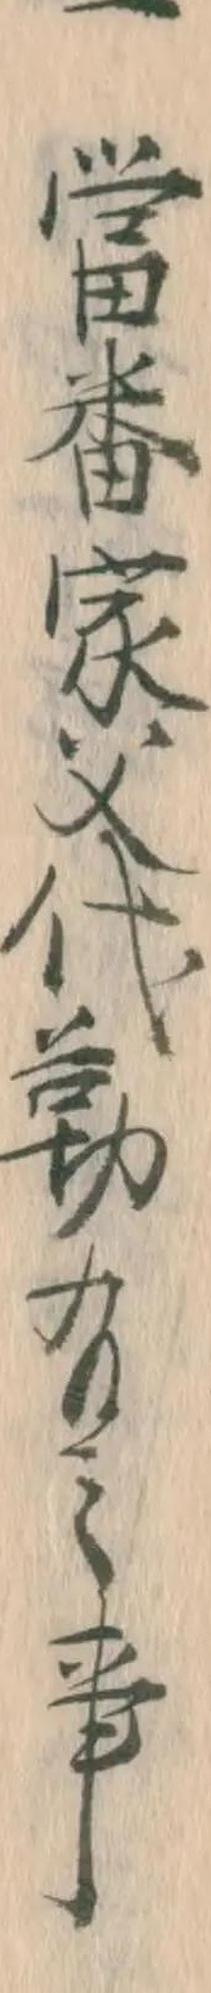一當番家父代勤有之事
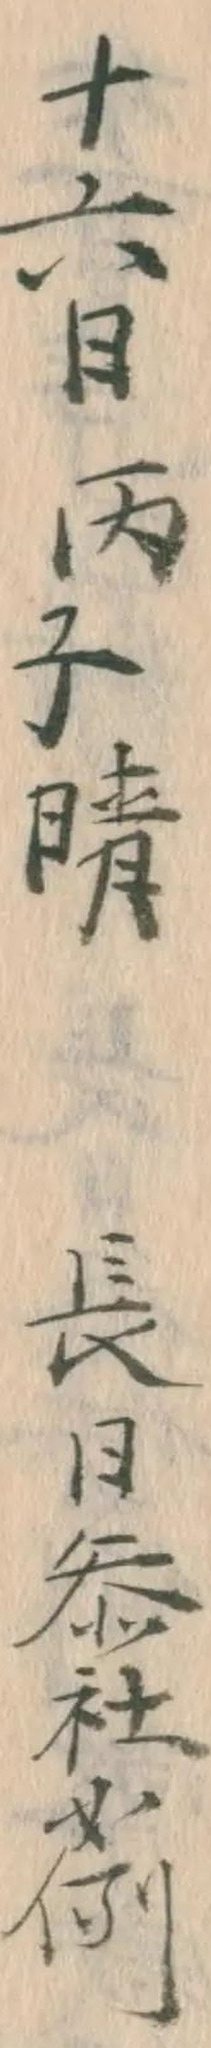十六日丙子晴長日参社如例
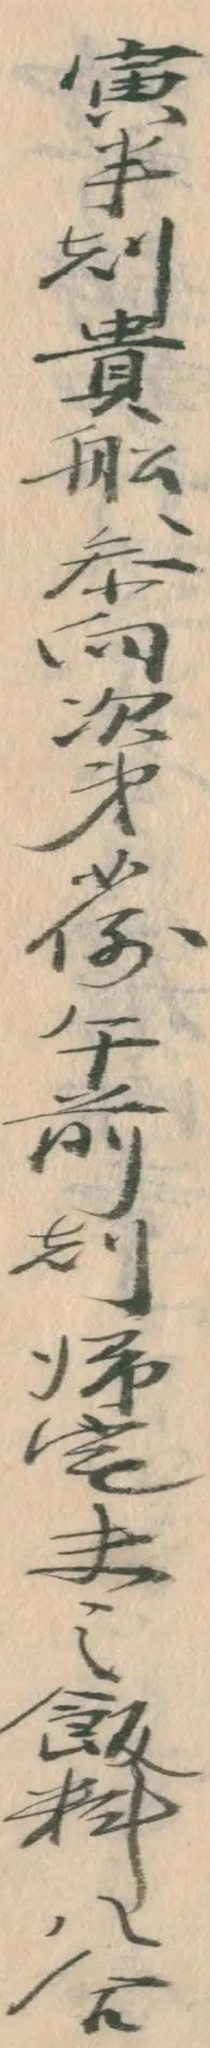一寅半刻貴舩ヘ参向次第如例午前刻帰宅夫之飯料八合
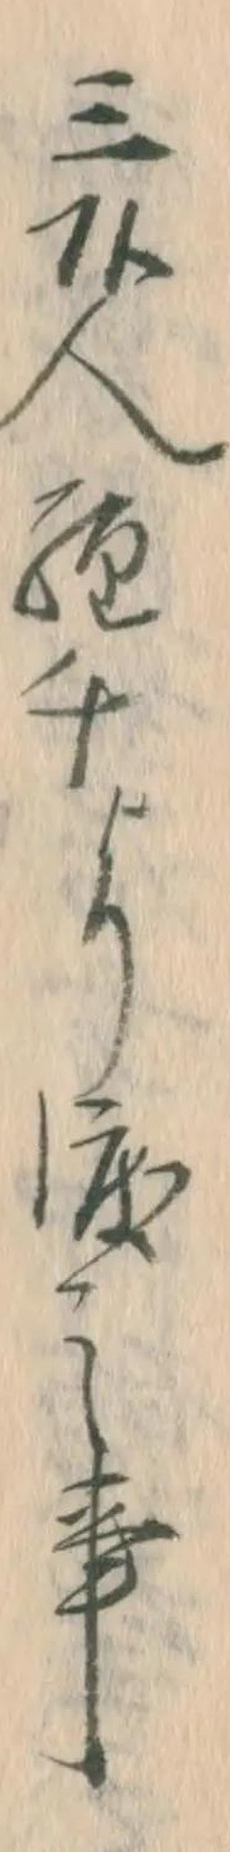三頭人経千より渡之事
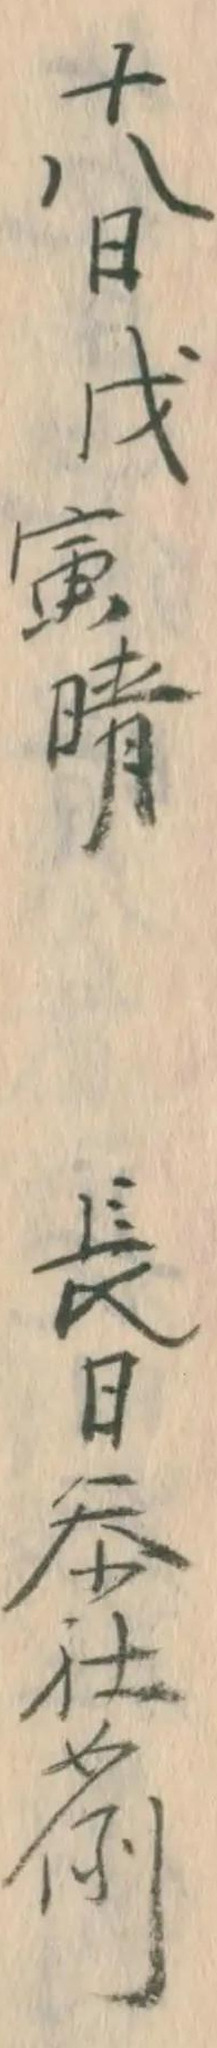十八日戊寅晴長日参社如例

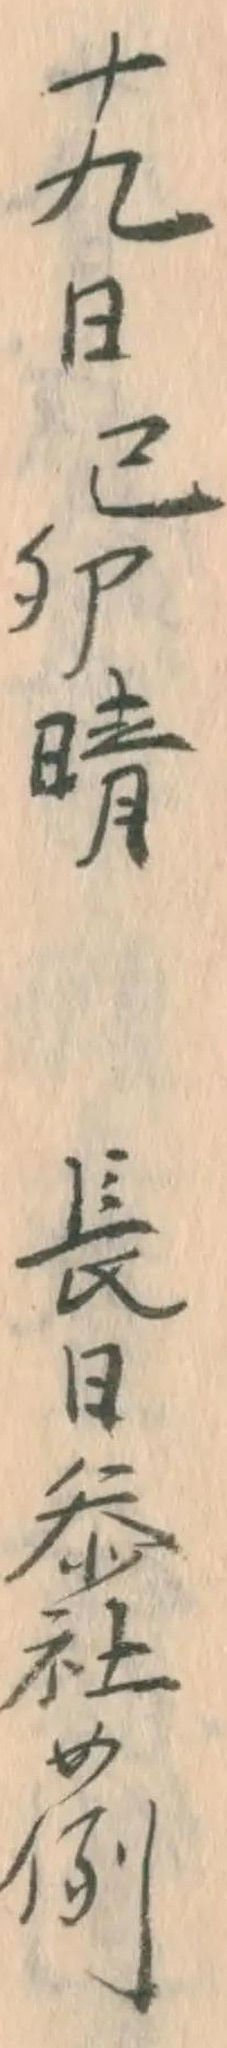十九日己申晴長日参社如例
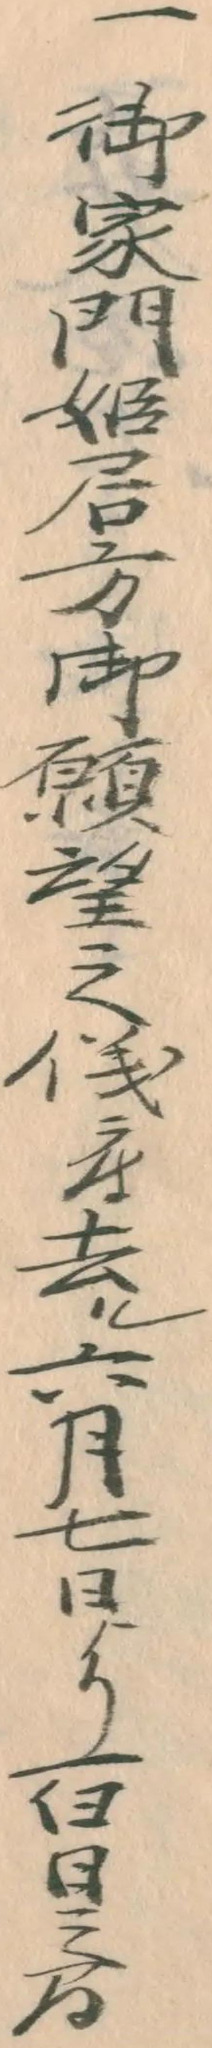一御家門姫居方御願望之儀ニ付去ル六月七日より百日之間
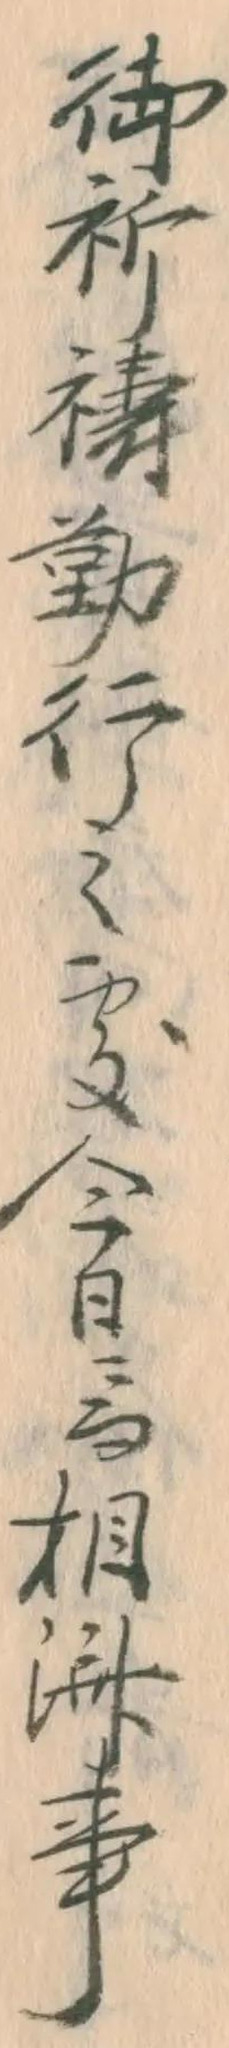御祈祷勤行之處今日ニ而相済事
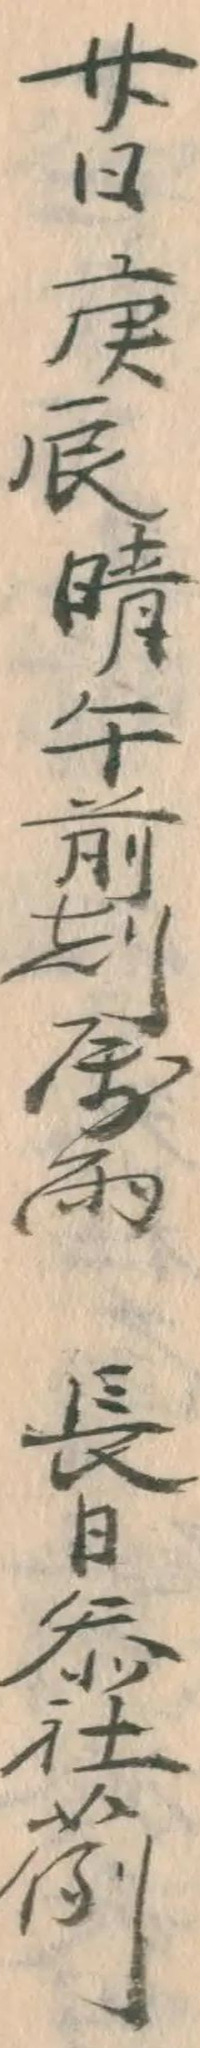廿日庚辰晴午前刻属雨長日参社如例
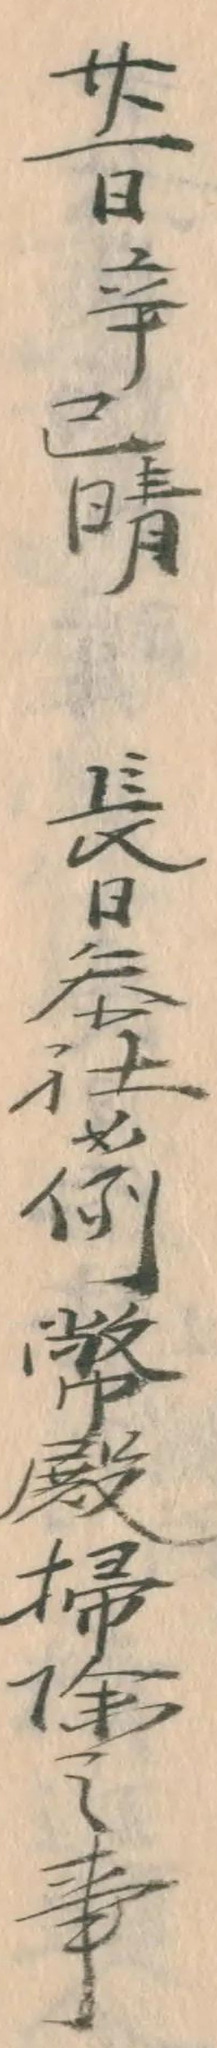廿一日辛巳晴長日参社如例幣殿掃除之事
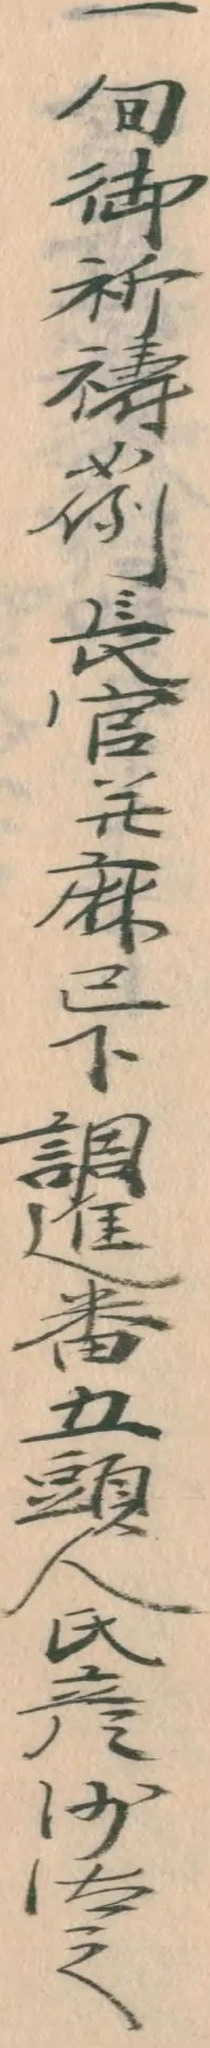一旬御祈祷如例長官并麻已下調進番五頭人氏彦沙汰之
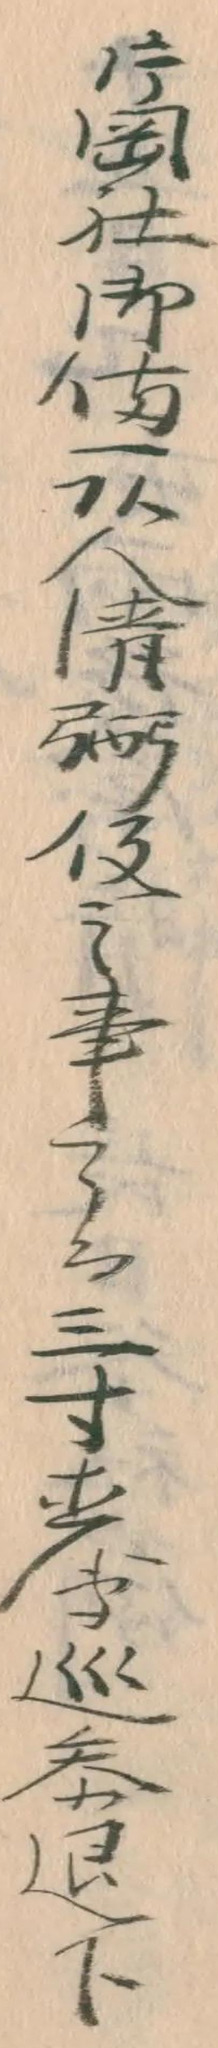片岡社御備一頭人清弼役之事了而三寸直會巡参退下
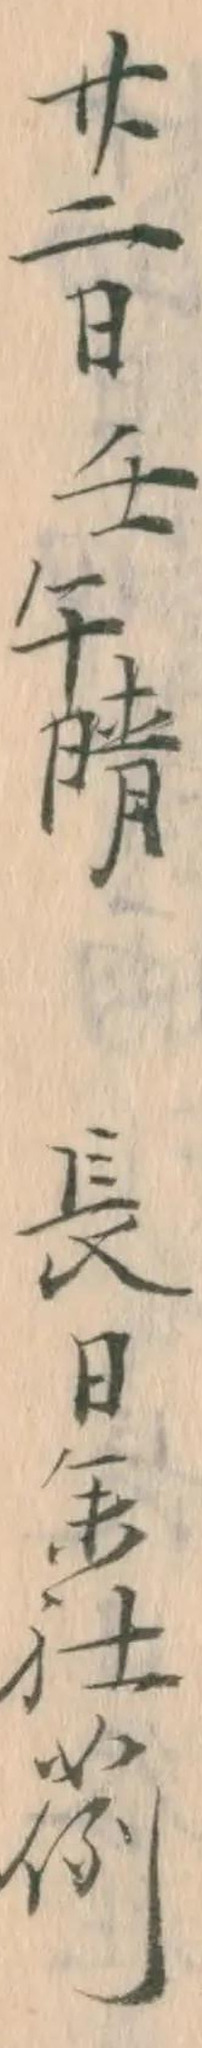廿二日壬午晴長日参社如例
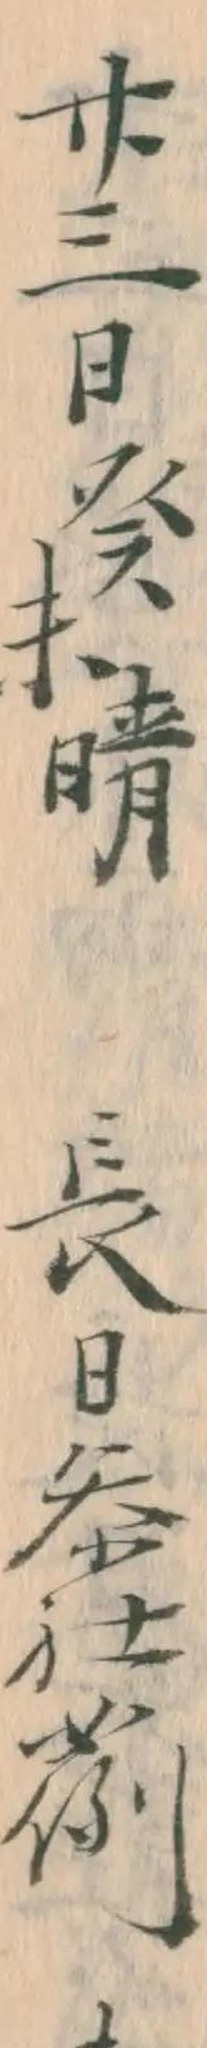廿二日壬午晴長日参社如例
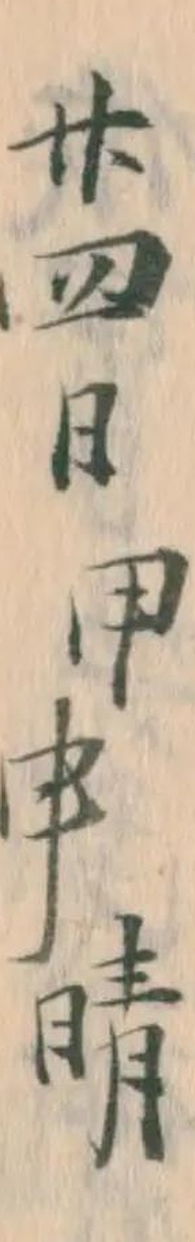廿四日甲申晴
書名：賀茂社記録. 第73冊
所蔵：国立国会図書館 National Diet Library, JAPAN
